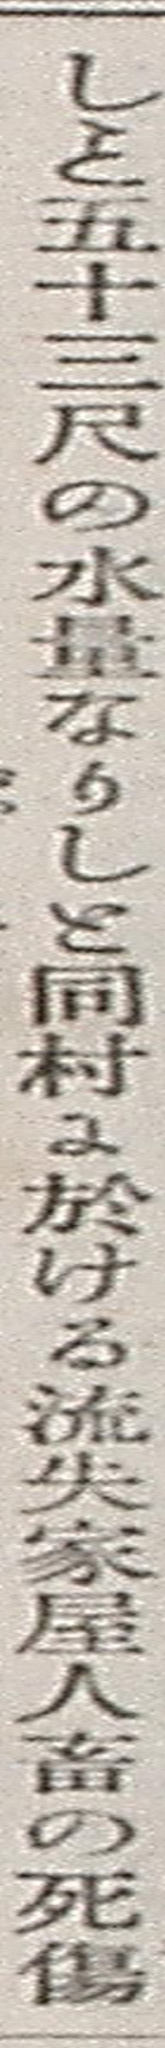しと五十三尺の水量なりしと同村に於ける流失家屋人畜の死傷
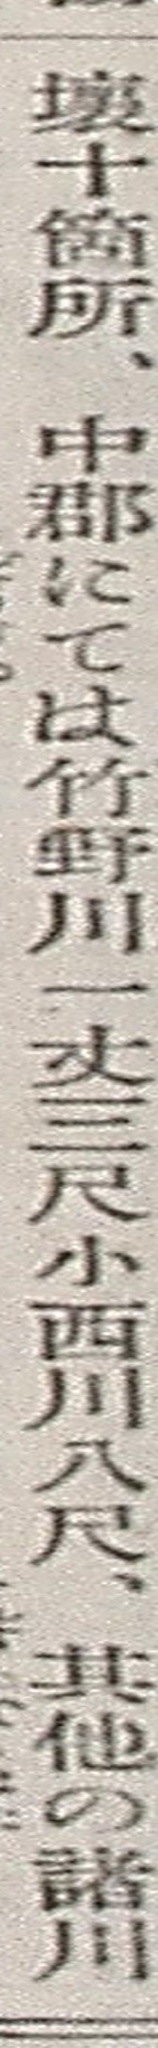壊十箇所、中部にては竹野川一丈三尺小西川八尺、其他の諸川
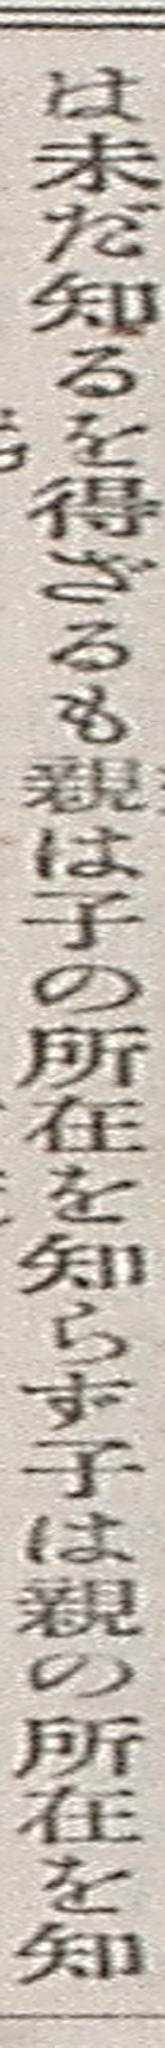は未だ知るを得ざるも親は子の所在を知らず子は親の所在を知
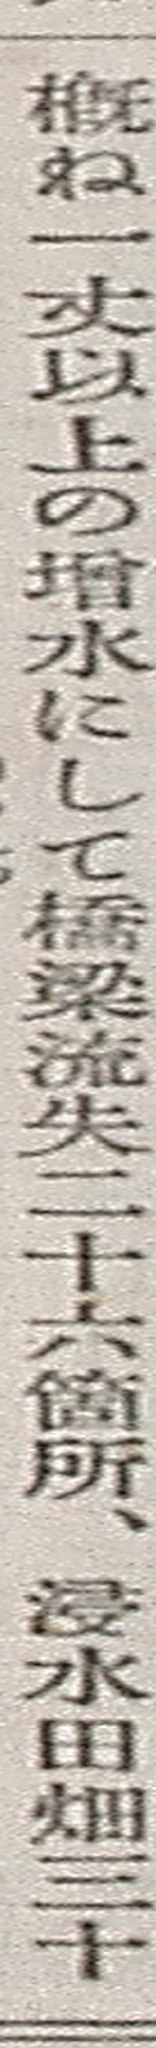概ね一丈以上の増水にして橋梁流失二十六箇所、浸水田畑三十
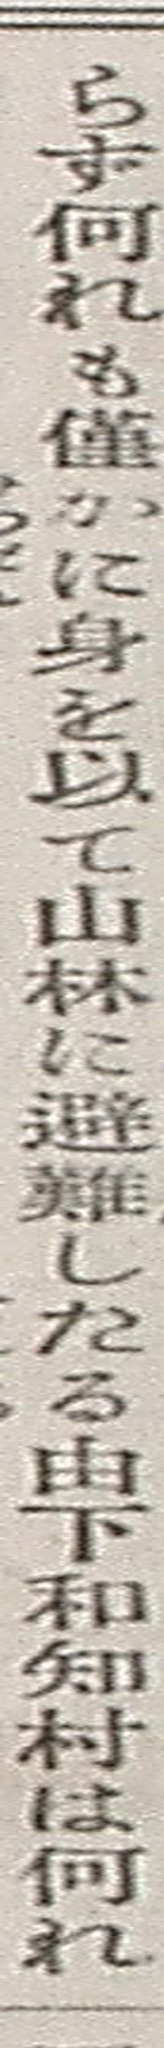らず何れも僅かに身を以て山林に避難したる由下和知村は何れ
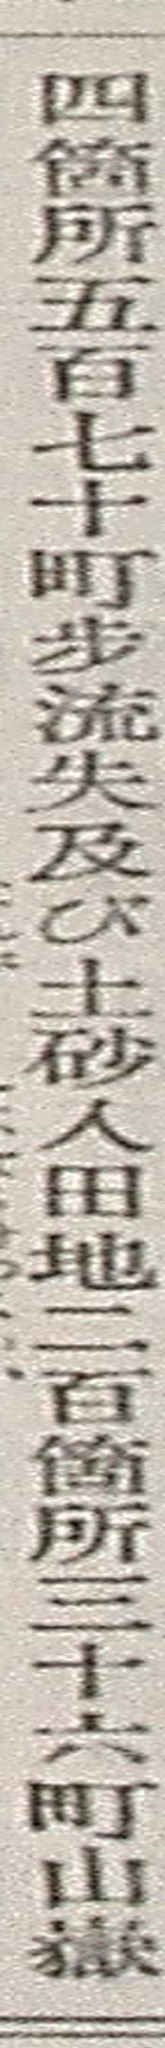四箇所五百七十町歩流失及び土砂入田地二百箇所三十六町歩山嶽
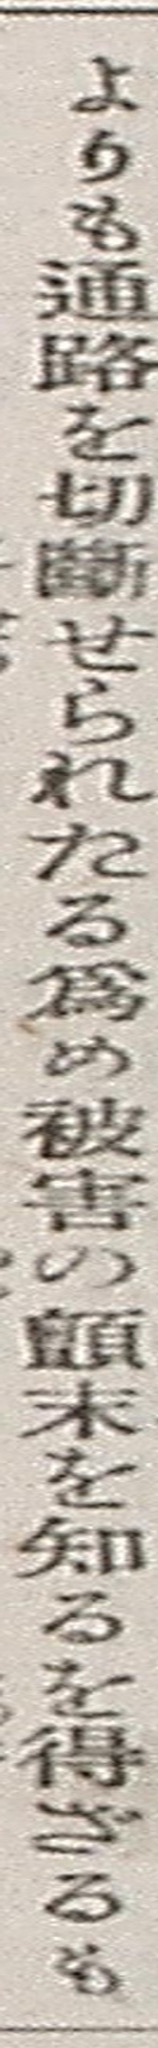よりも通路を切断せられたる為め被害の顛末を知るを得ざるも
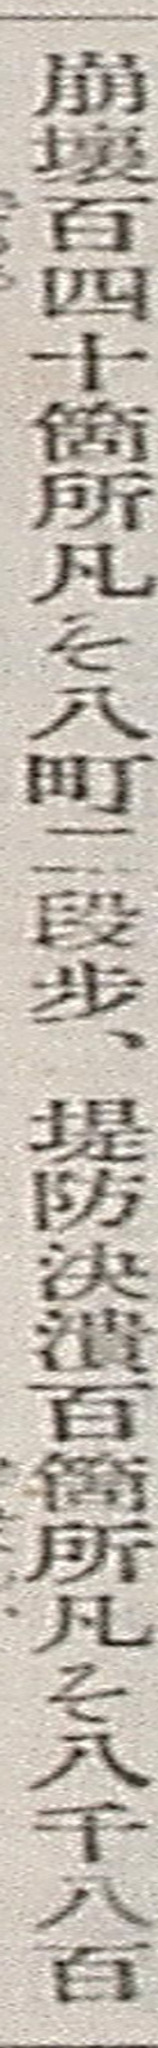崩壊百四十箇所凡そ八町二反歩、堤防决潰百箇所凡そ八千八百
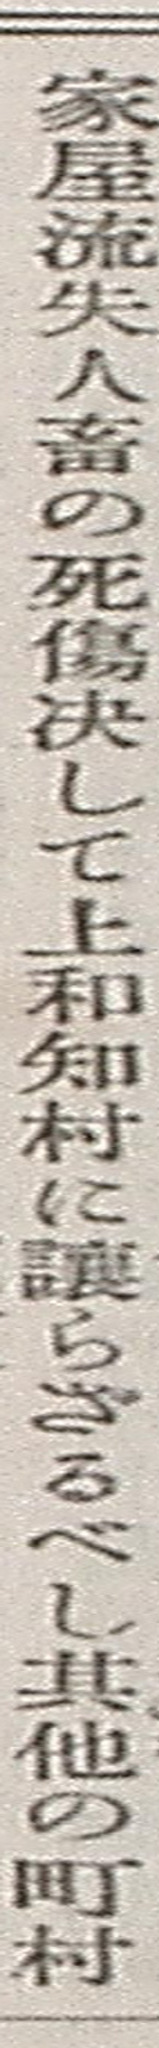家屋流失人畜の死傷决して上和知村に譲らざるべし其他の町村
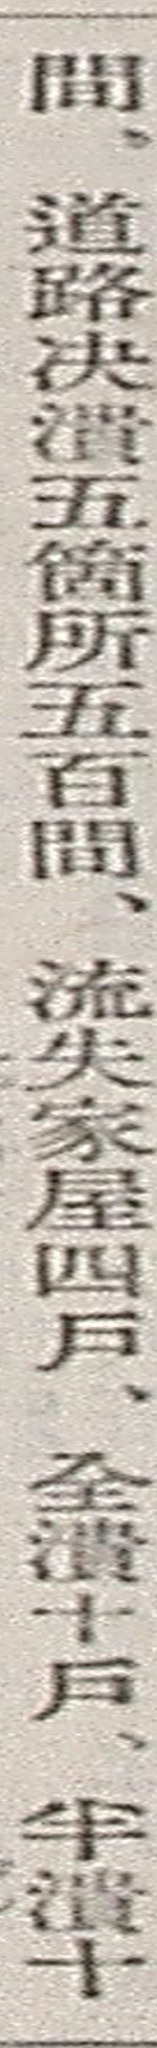間、道路决潰五箇所五百間、流失家屋四戸、全潰十戸、半潰十
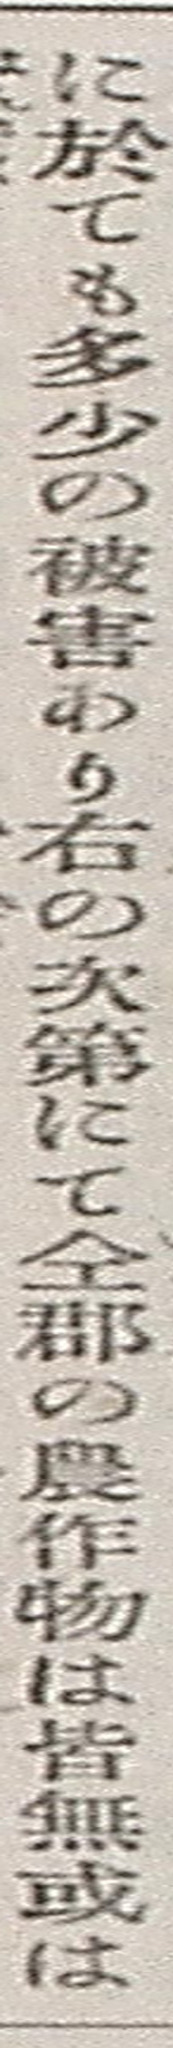に於ても多少の被害あり右の次第にて同郡の農作物は皆無或は
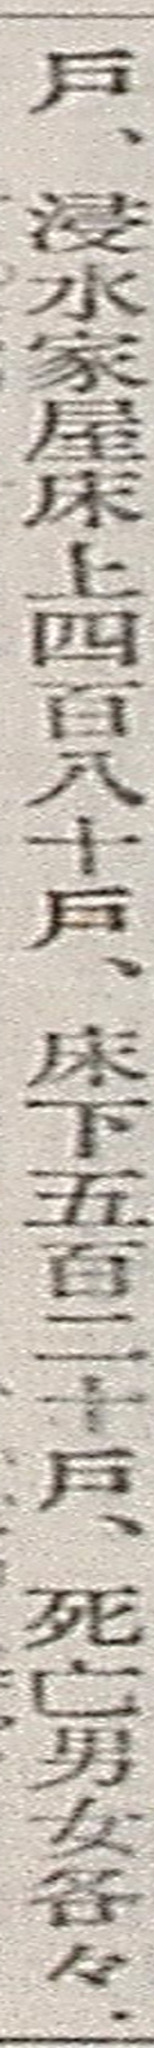戸、浸水家屋床上四百八十戸、床下五百二十戸、死亡男女各々
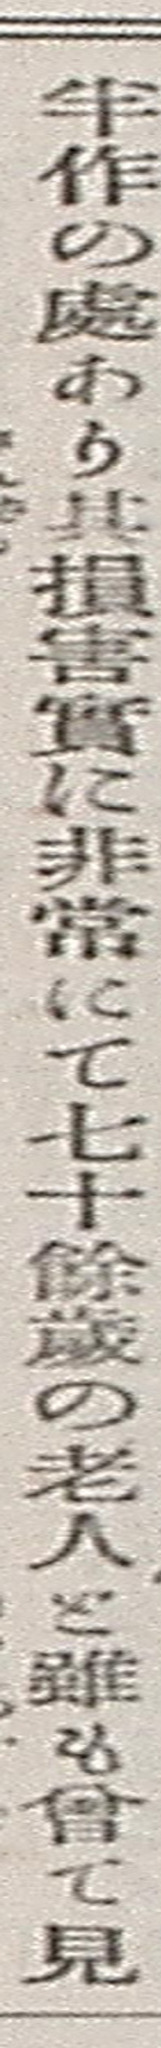半作の虞あり其損害実に非常にて七十餘歳の老人と雖も曾て見
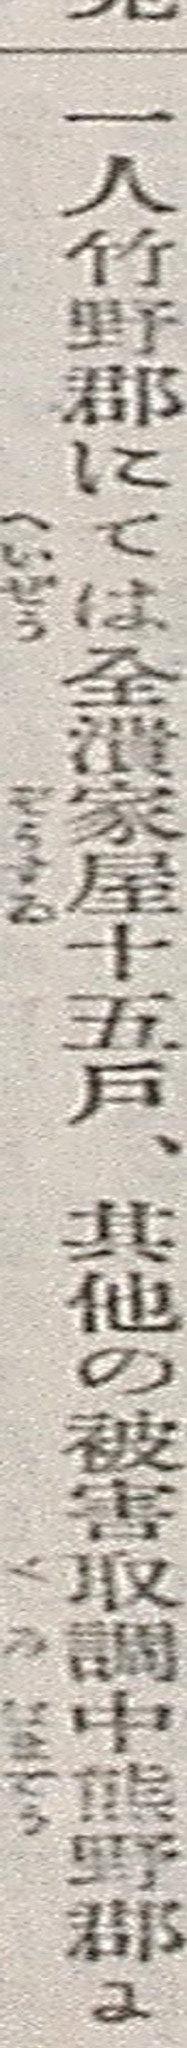一人竹野郡にては全潰家屋十五戸、其他の被害取調中熊野郡に
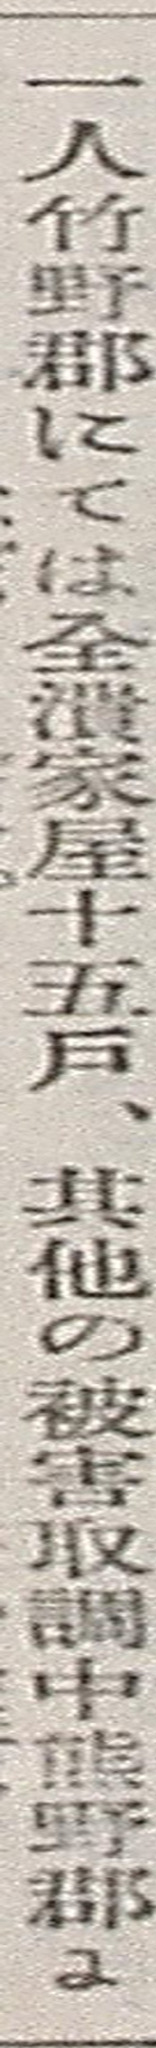一人竹野郡にては全潰家屋十五戸、其他の被害取調中熊野郡に
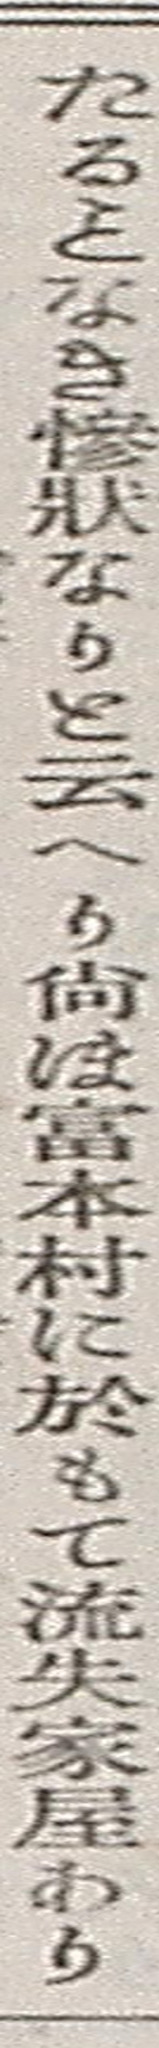たることなき惨状なりと云へり尚ほ富本村に於もて流失家屋あり
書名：風俗畫報臨時増刊第百二十六號　洪水被害録（中）
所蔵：東京大学地震研究所図書室 Earthquake Research Institute Library, The University of Tokyo, JAPAN
